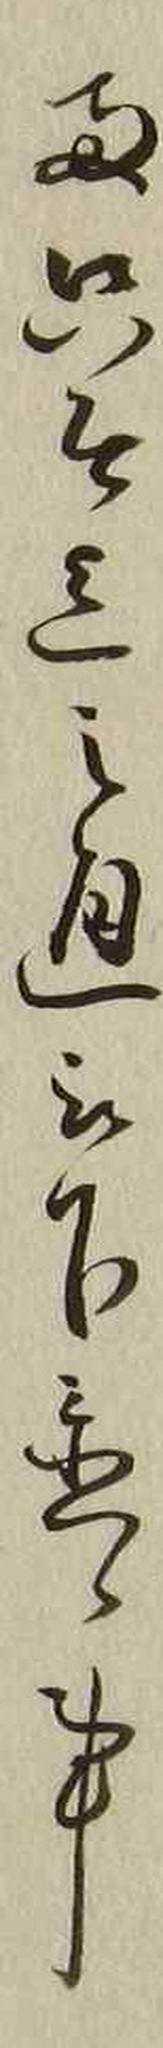両只今迄之通被下置候事
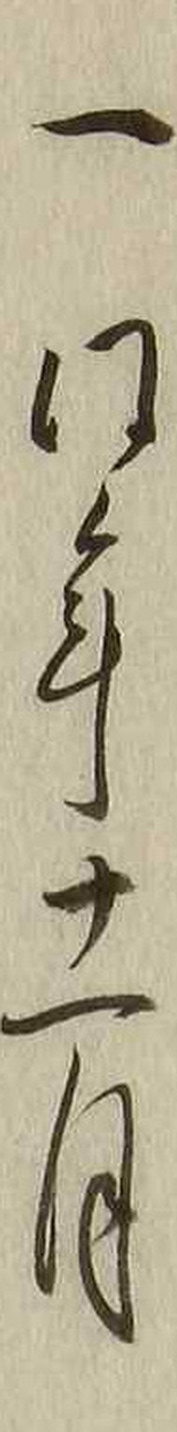一同年十一月
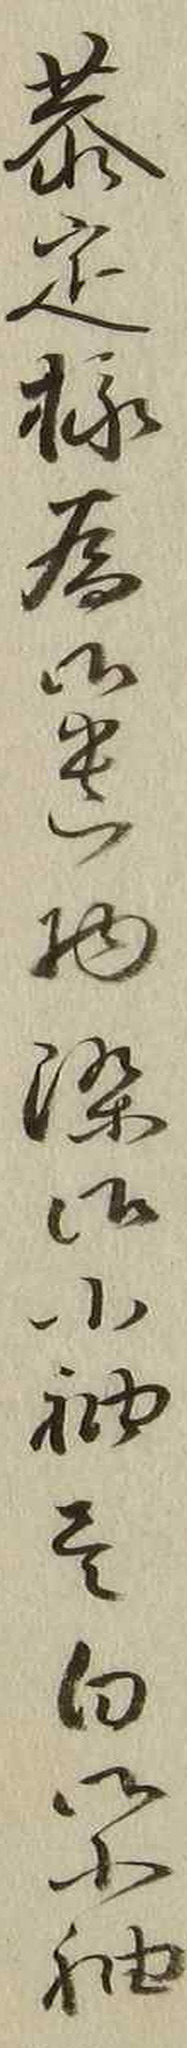恭定様為御遺物染御小袖壱白御小袖
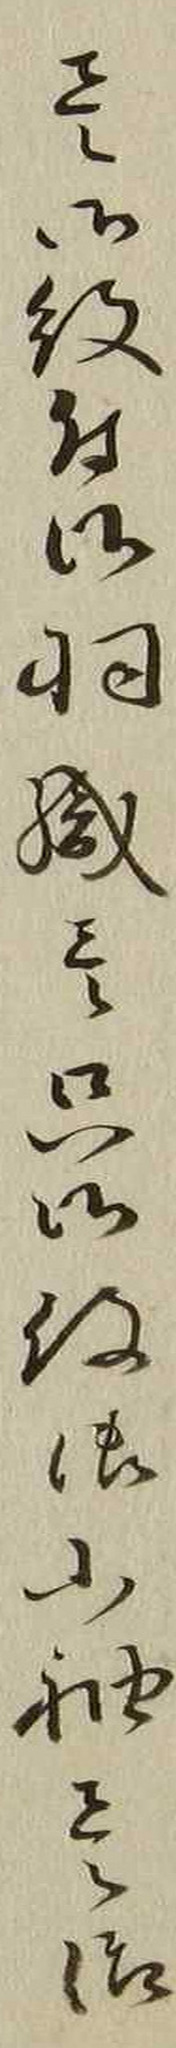壱御紋付御羽織壱只御紋御小袖壱御
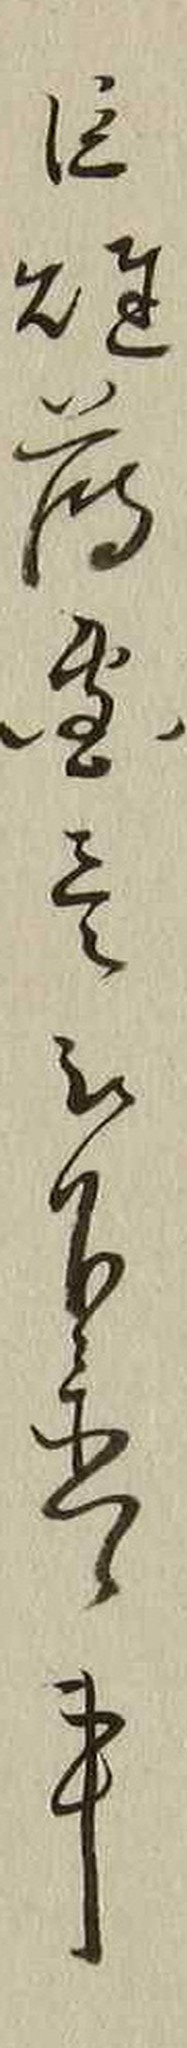炬燵薄団壱被下置候事
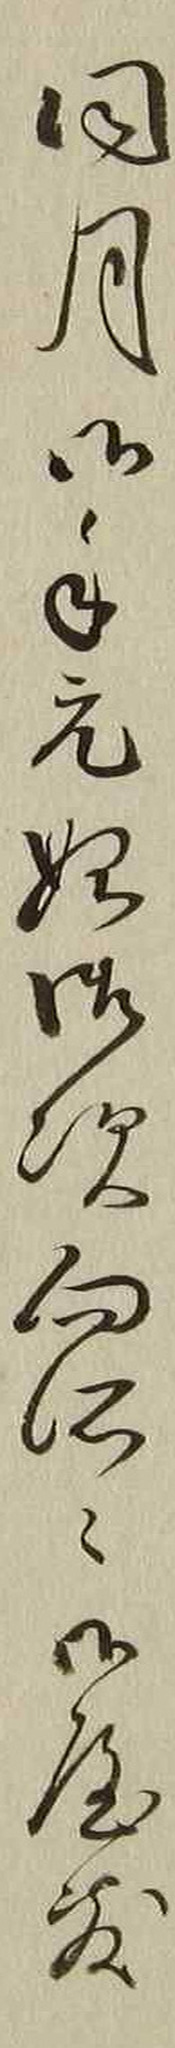同月御手元始御次向所々御屋敷
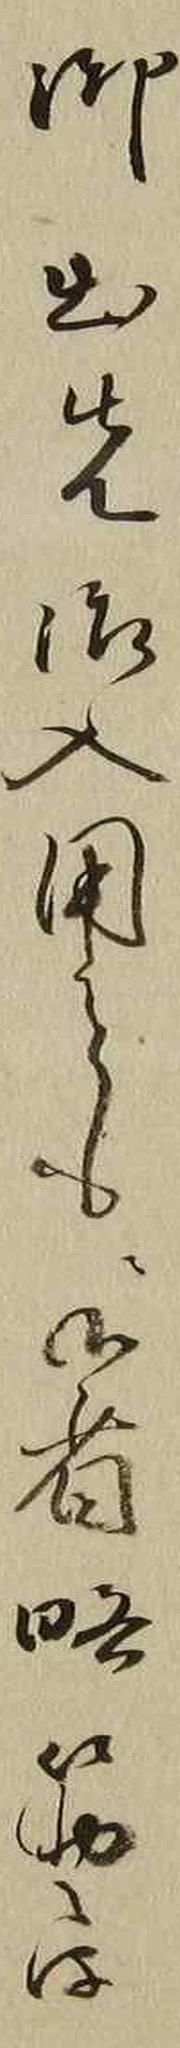御出先御入用ともニ御省略筋候之儀
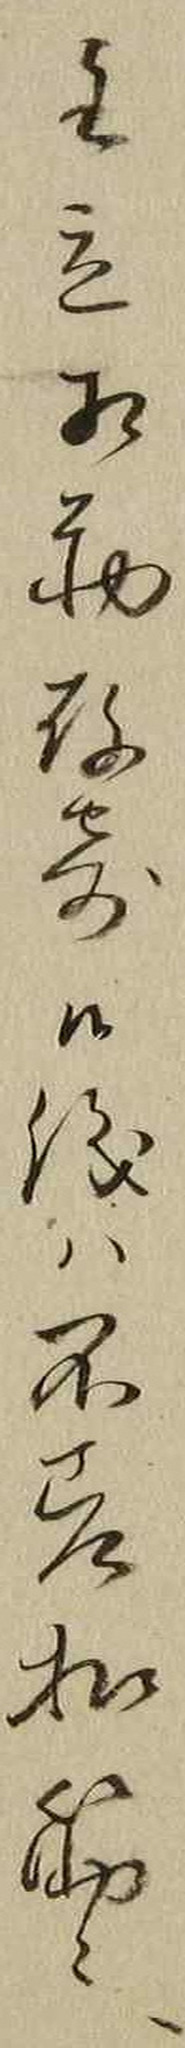主立相勤存寄候儀ハ不差控筋々へ
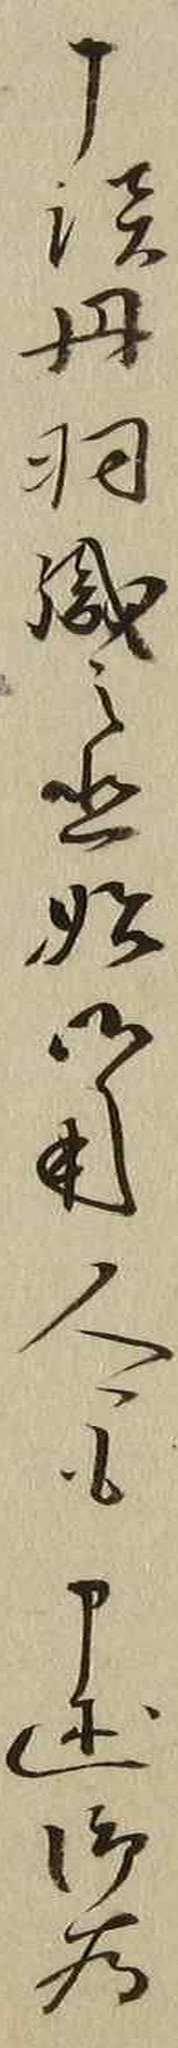申談丹羽織之丞始御用人へも申述御為
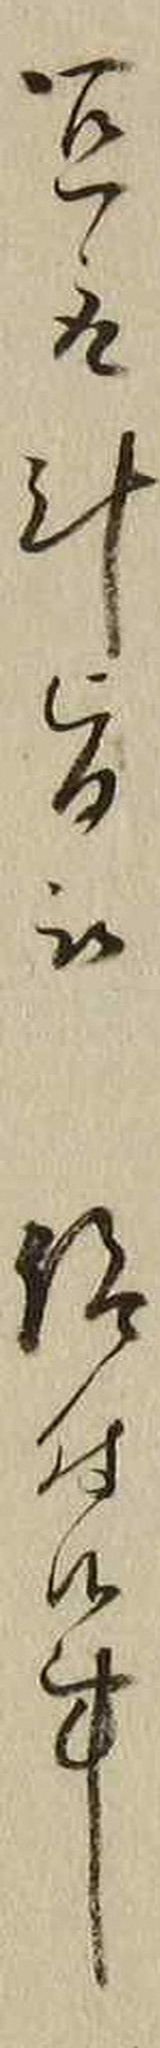宜取計旨被仰付候事
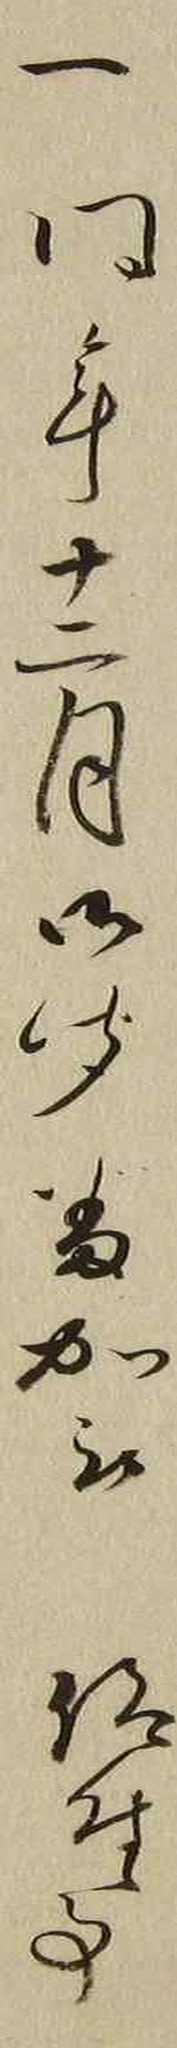一同年十二月御聞番加被仰付候事
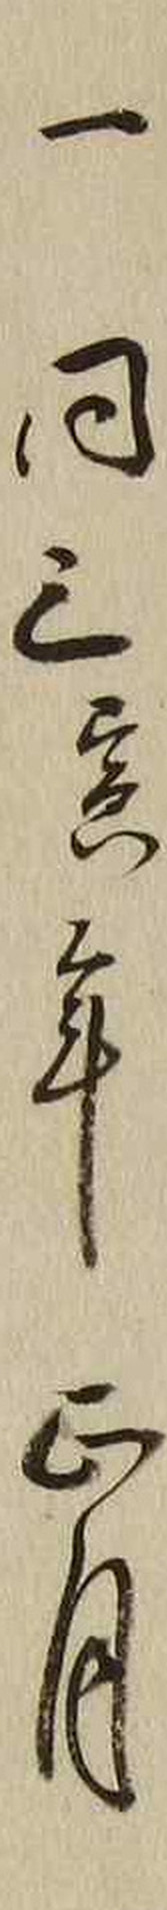一同三寅年正月
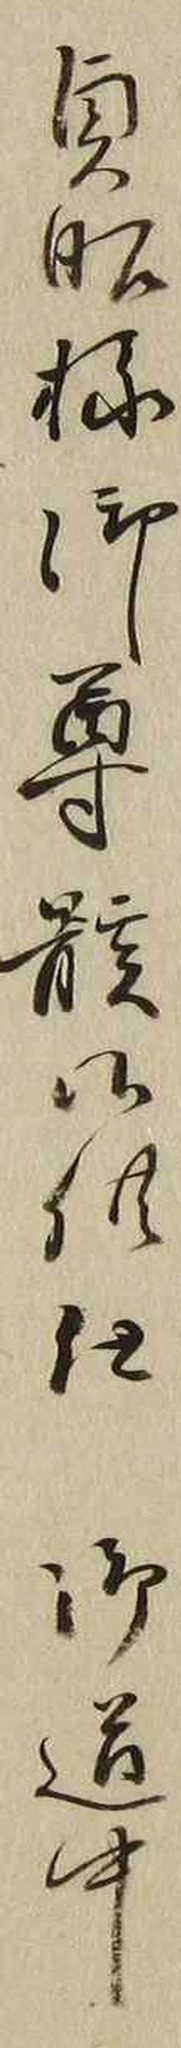貞昭様御尊骸御供仕御道中
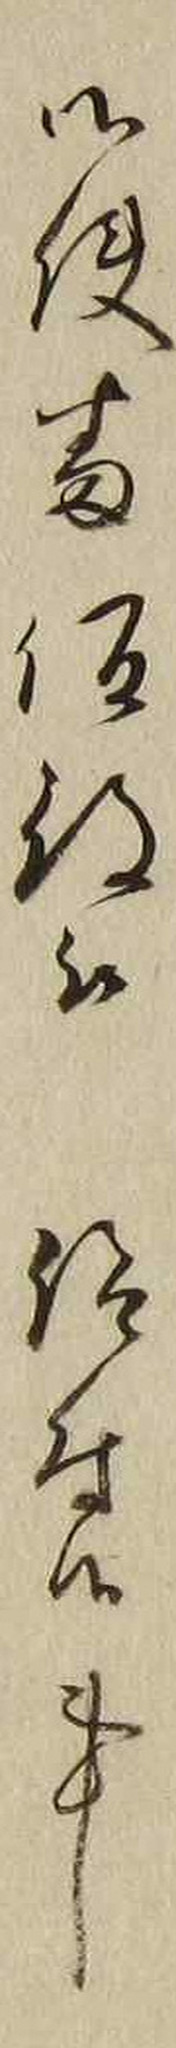御使番仮役被仰付候事
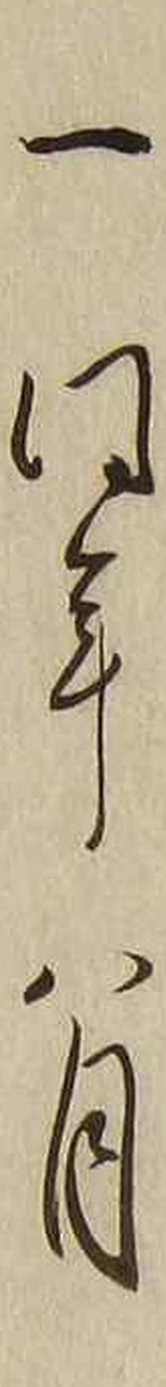一同年八月
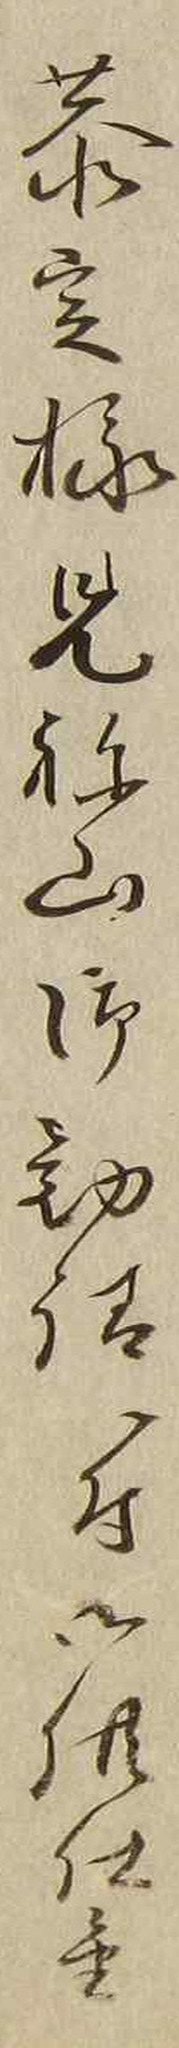恭定様見祢山御勧請ニ付御供仕金
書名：諸士系譜　巻之25　い之部25
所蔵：会津若松市立会津図書館
